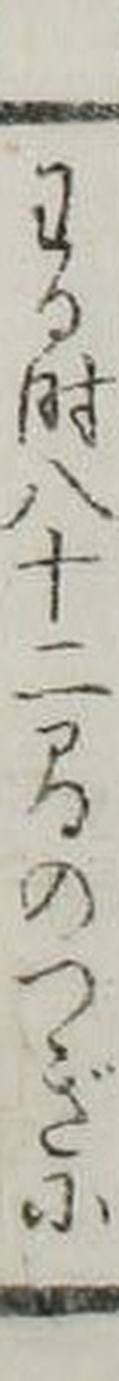わる時八十二間のつぎに
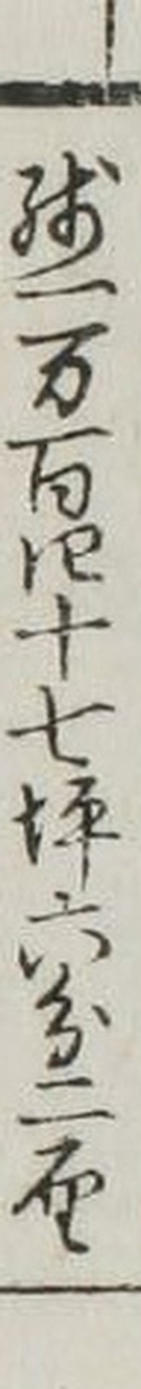残一万百四十七坪六分二厘
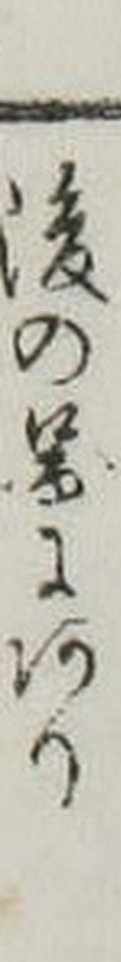後の図にあり
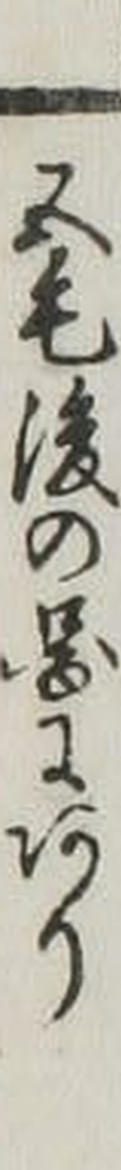五毛後の図にあり
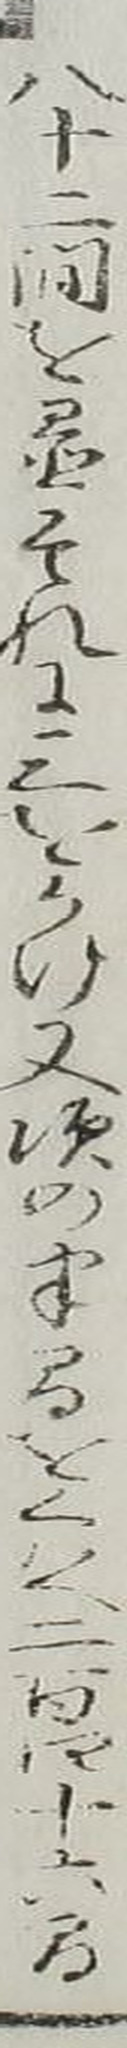◆毛八十二間を置それに三をかけ又次の半間をくはへ二百四十六間
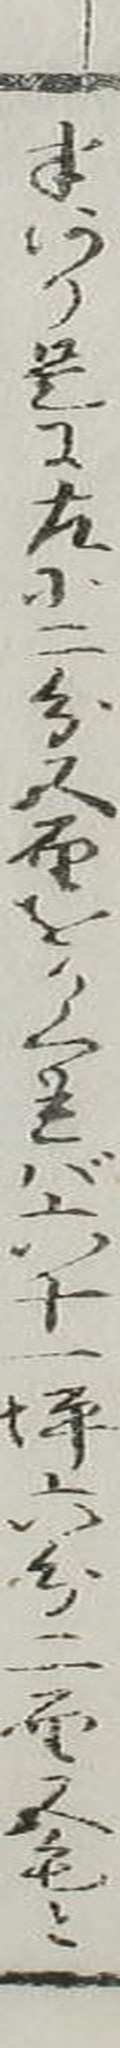厘◆◆半あり是に左に二分五厘をかくれば六十一坪六分二厘五毛と
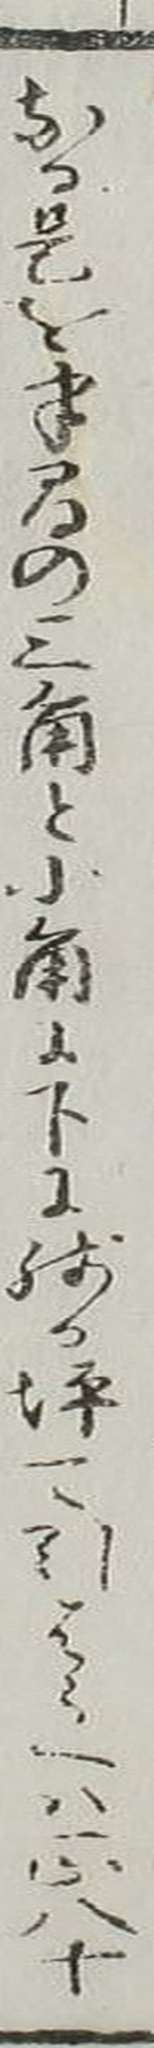◆分◆なる是を半間の三角と小角に下に残る坪て引はらへは正八十
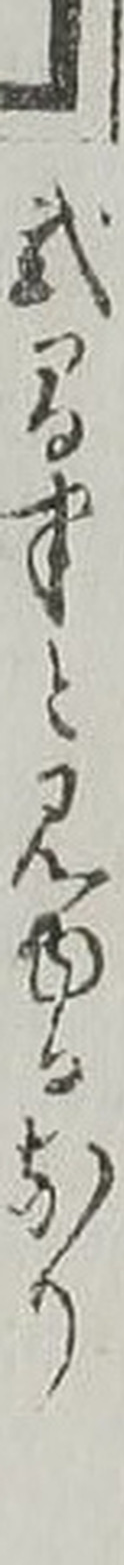坪◆弐間半と見ゆるなり

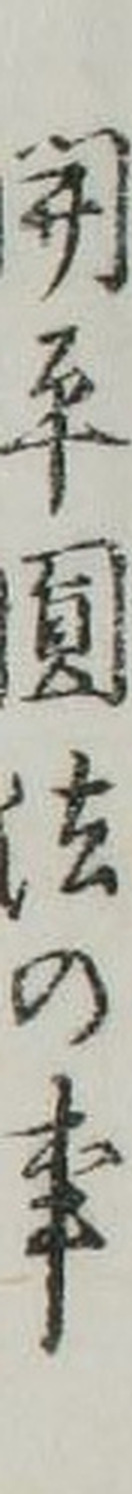○開平円法の事
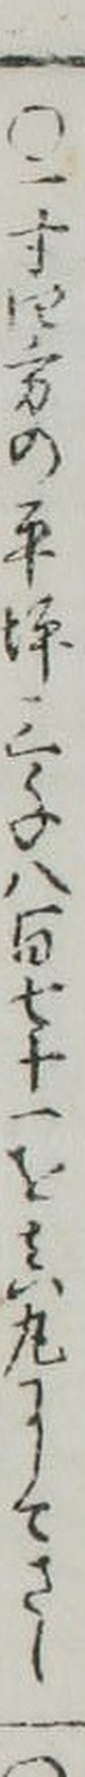○一寸四方の平坪三千八百七十一を真丸にしてさし
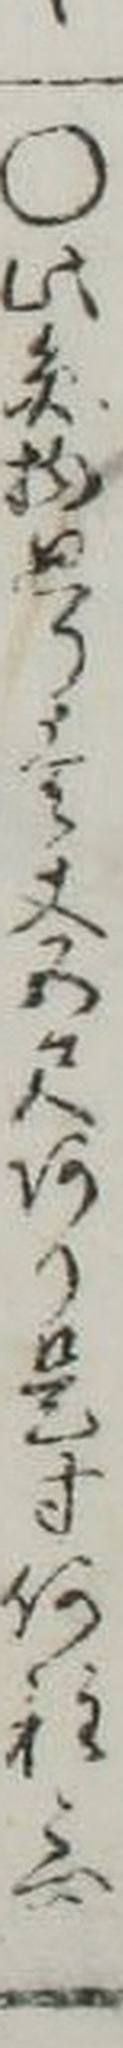○此円物廻り壱丈五尺あり是寸何程と問
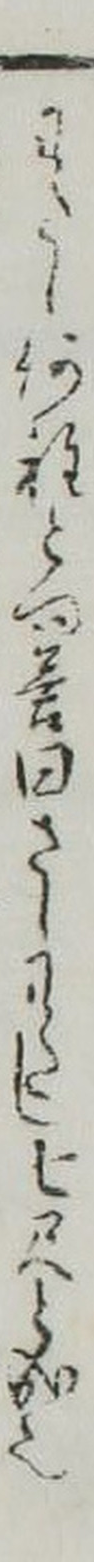わたし何程と問答曰さしわたし七尺と成也
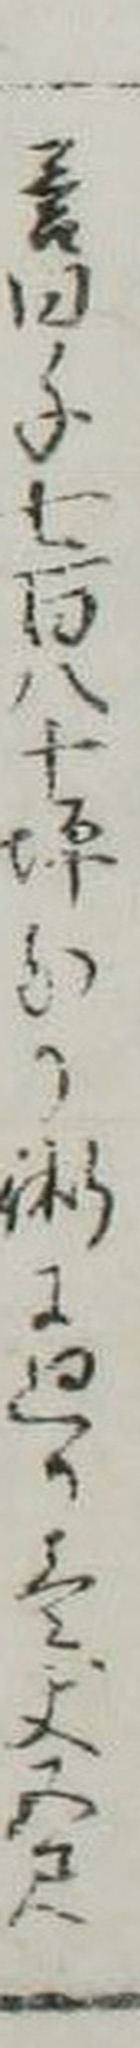答曰千七百八十坪なり術に廻り壱丈五尺
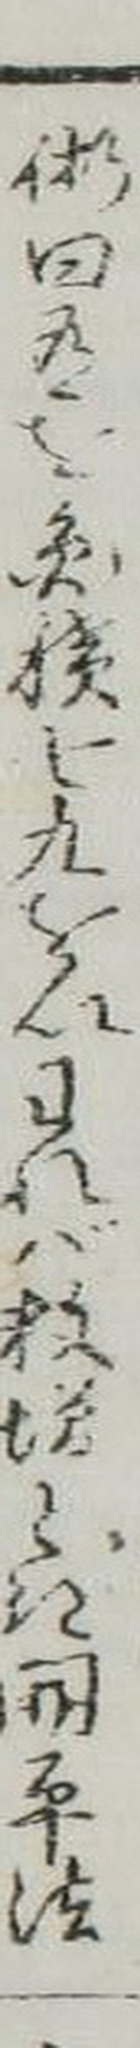術曰有を円積七九を以われば数増とき開平法
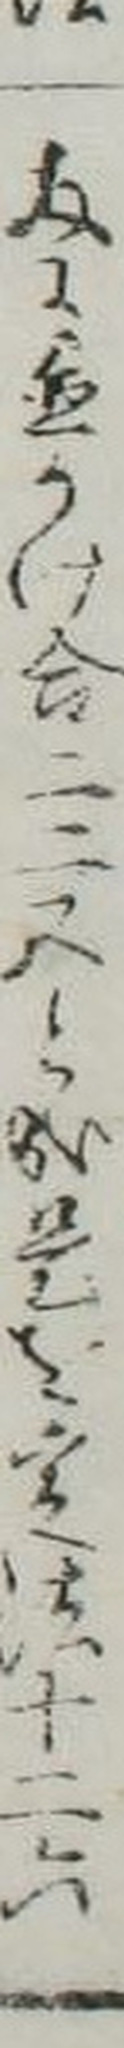両に置かけ合二二五と成是を定法十二六
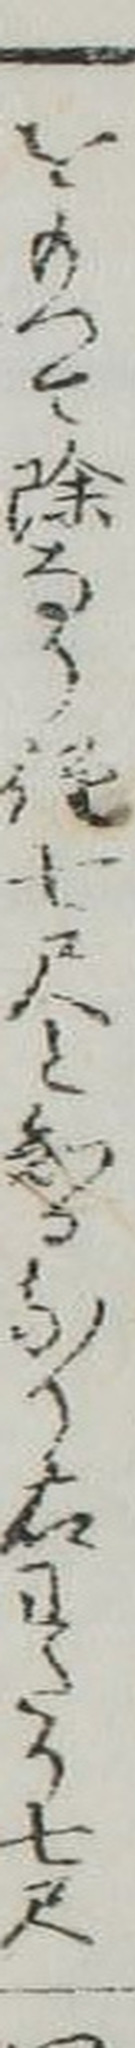をもつて徐なり径七尺と知るなり右わたり七尺
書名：宝玉塵劫記
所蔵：東京学芸大学教育コンテンツアーカイブ
